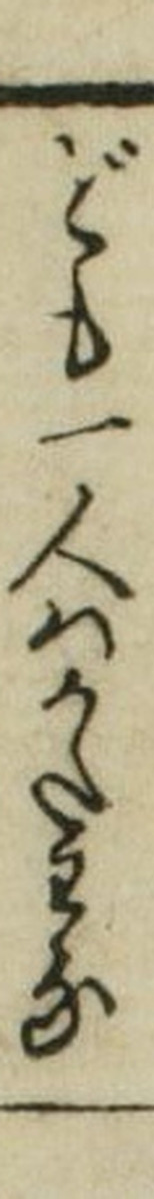ども一人はかたわな
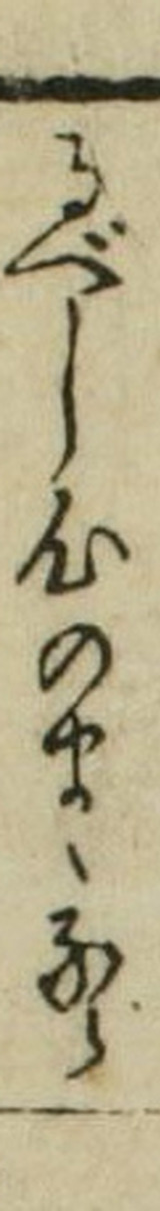るべし心のまゝなら
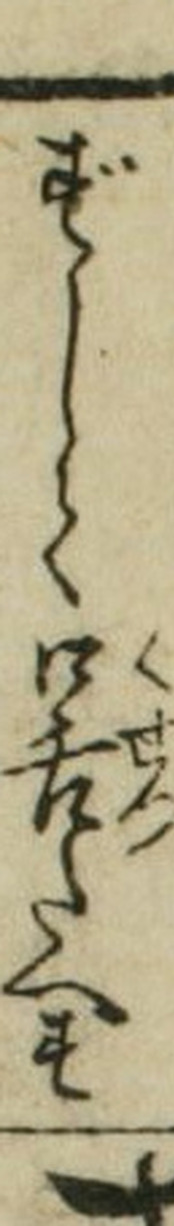ずして口舌たへす
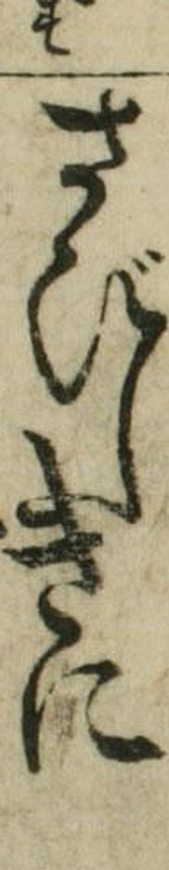さびしきに
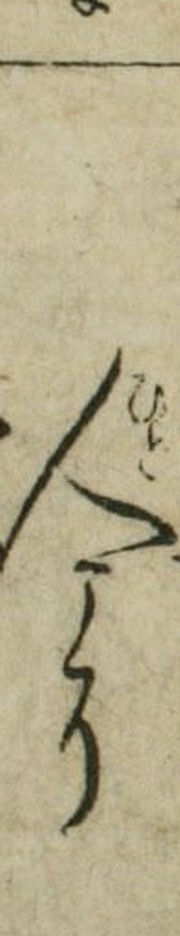人こそ
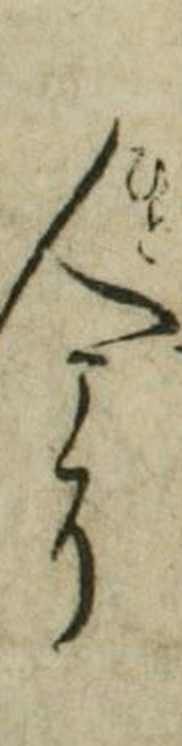人こそ
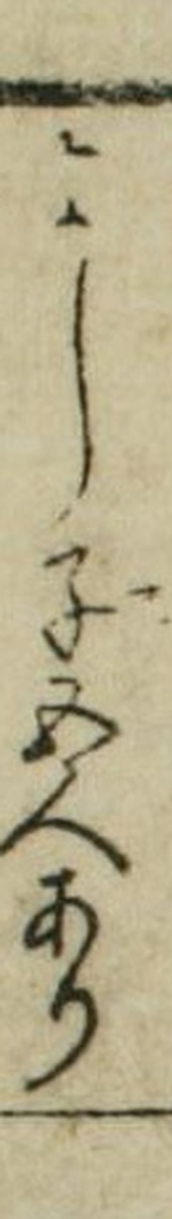よし子五人あり
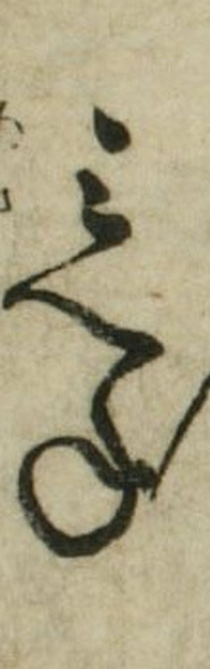みえね
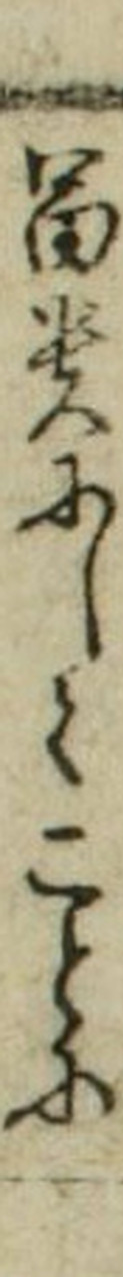富貴にしてことに
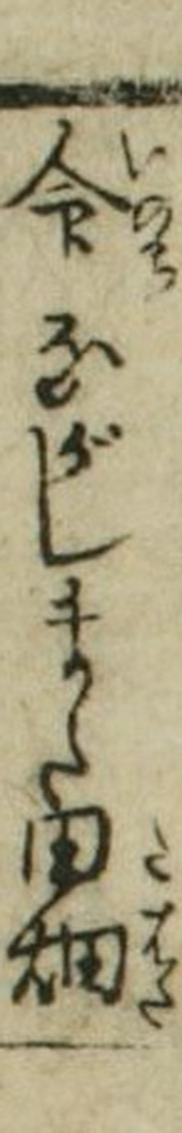命ながしまた田畑

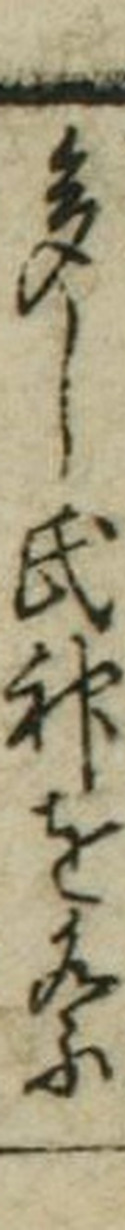多し氏神を祭
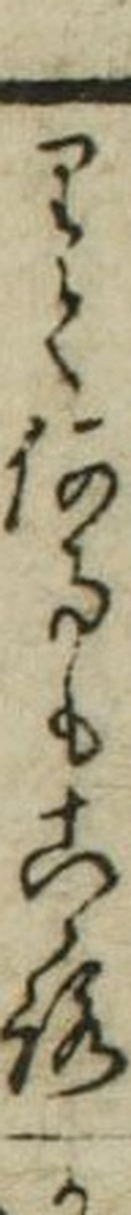りて何事もこゝろ
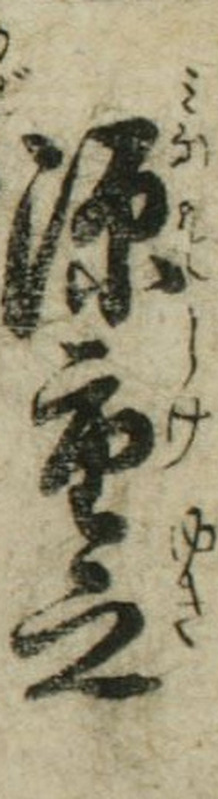源重行
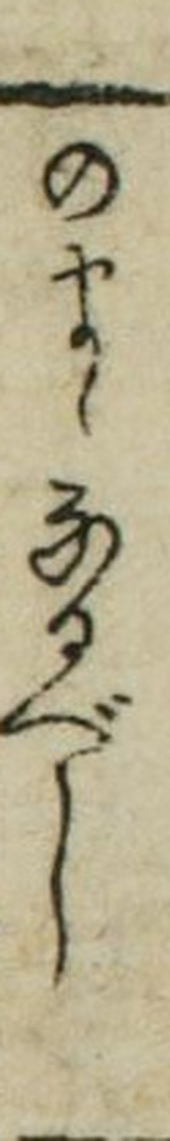のまゝなるべし
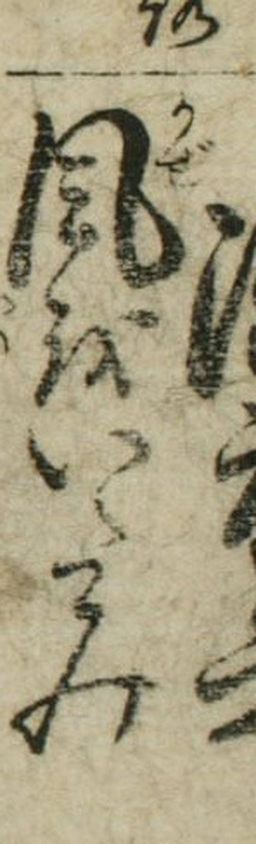風をいたみ
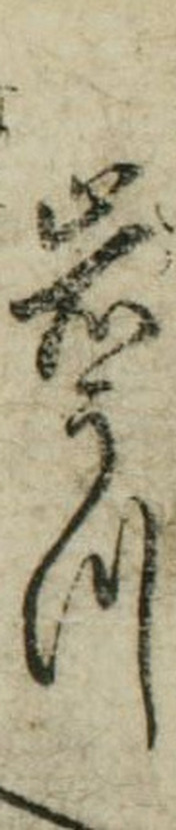岩うつ
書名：百人一首
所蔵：東京学芸大学教育コンテンツアーカイブ
